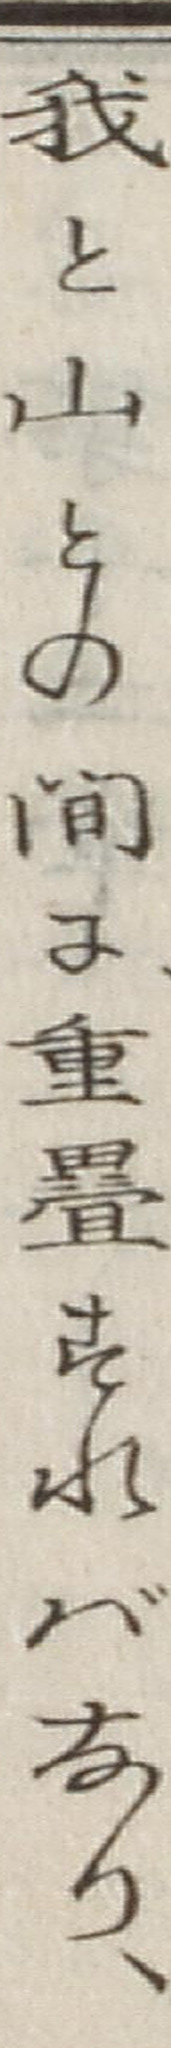我と山との間に、重畳すればなり、
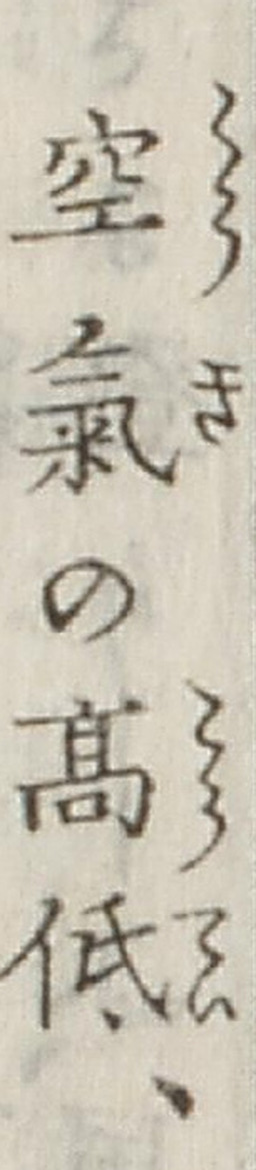空気の高低、
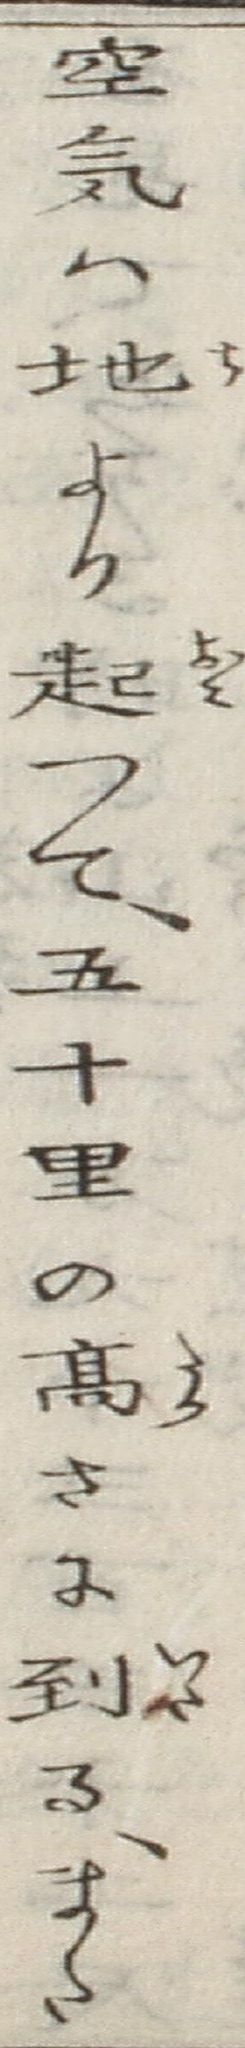空気は地より起つて、五十里の高さに到る、また
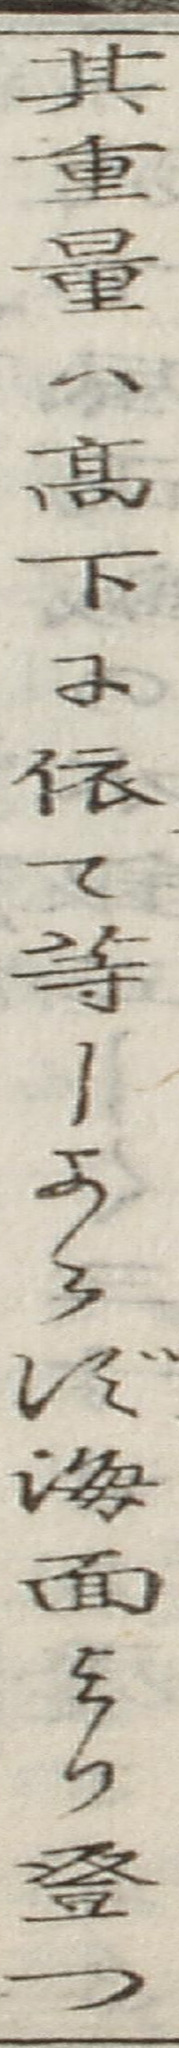其重量は高下に依て等しならず、海面より登つ
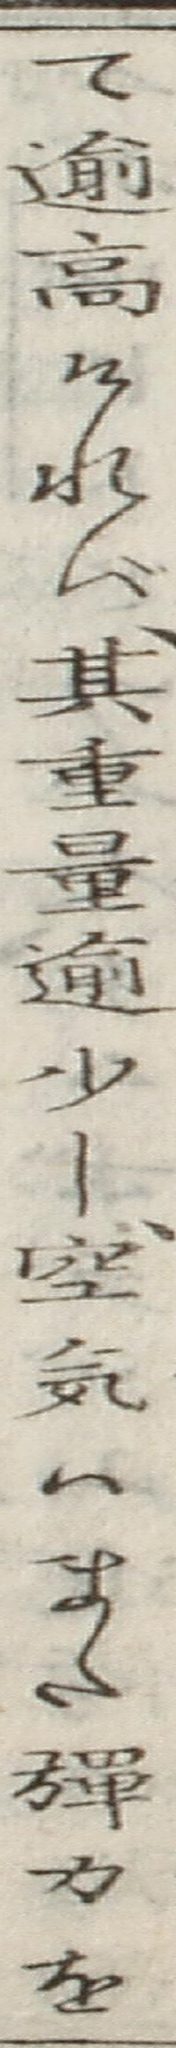て愈高ければ、其重量愈少し、空気はまた弾力を
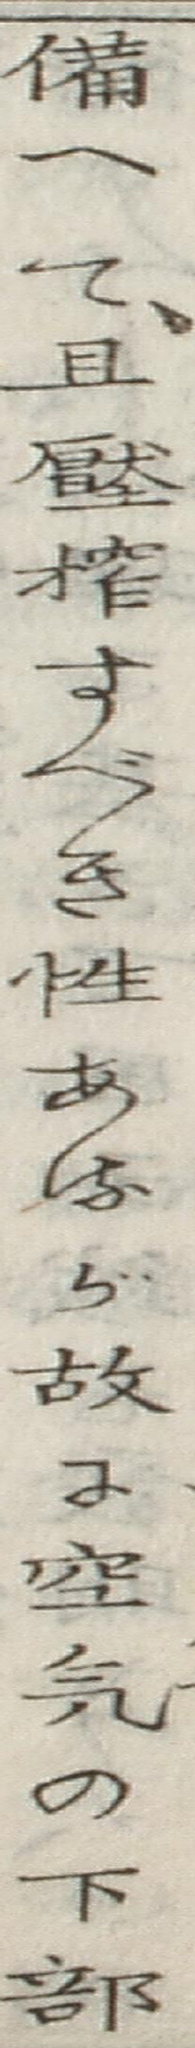備へて、且圧搾すべき性あるが故に、空気の下部
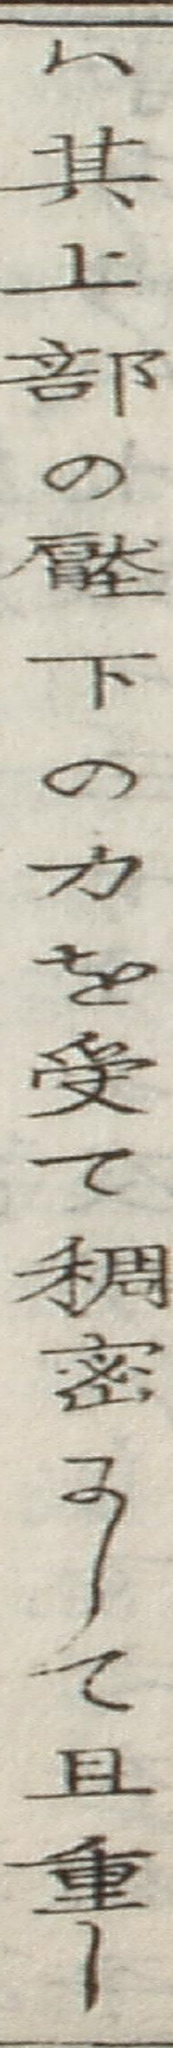は其上部の圧下の力を受て、稠密にして且重し
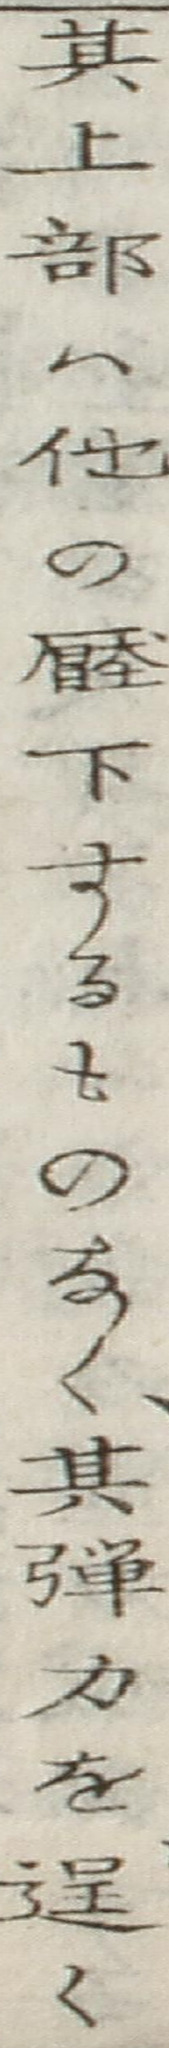其上部は他の圧下するものなく、其弾力を逞く
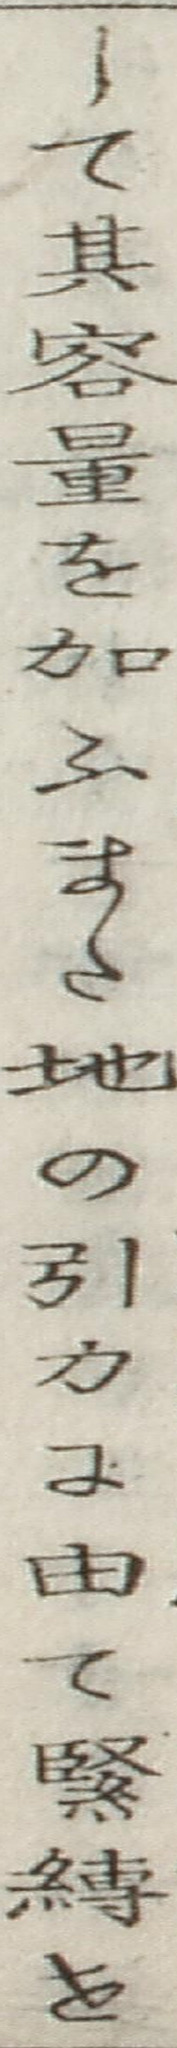して其容量を加ふ、ま地の引力に由て緊縛せ
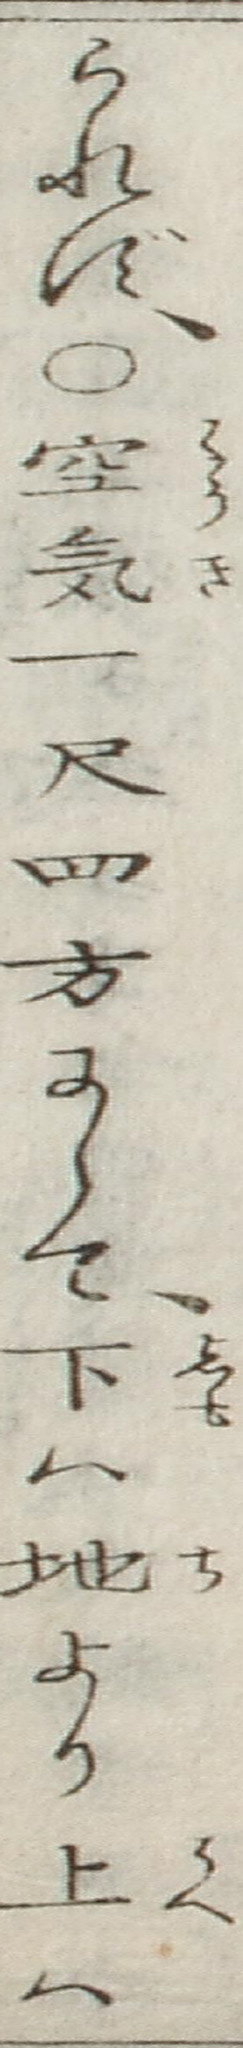られず、○空気一尺四方にして、下は地より上は

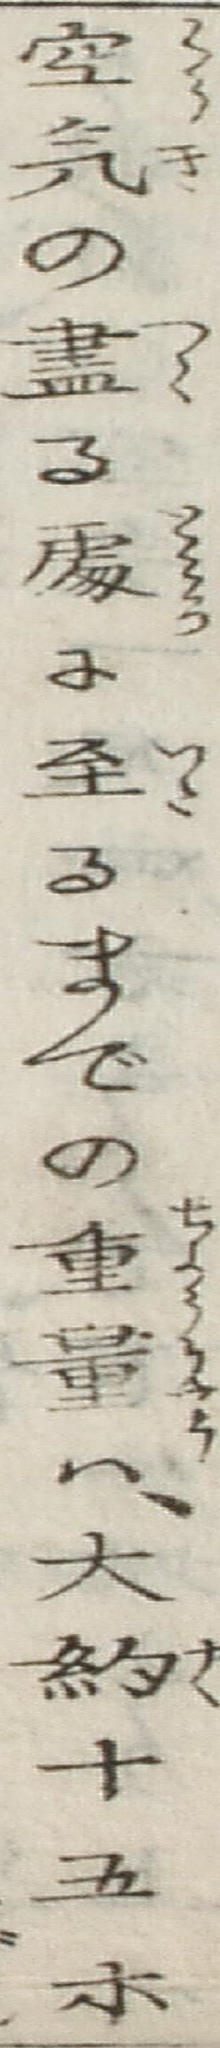空気の尽る処に至るまでの重量は、大約十五ホ
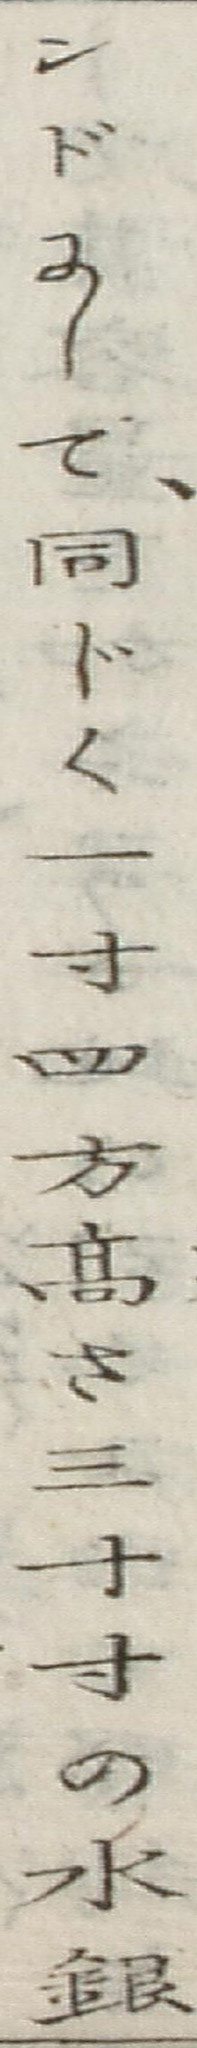ンドにして、同じく一寸四方高さ三十寸の水銀
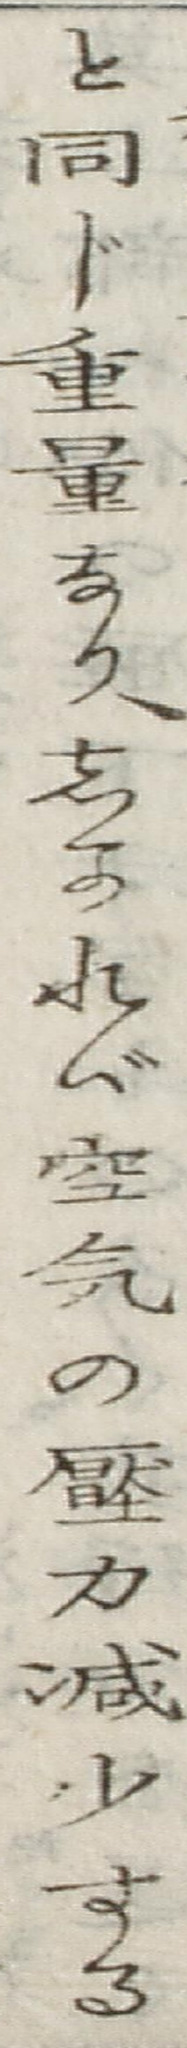と同じ重量なり、しかれば空気の圧力減少する
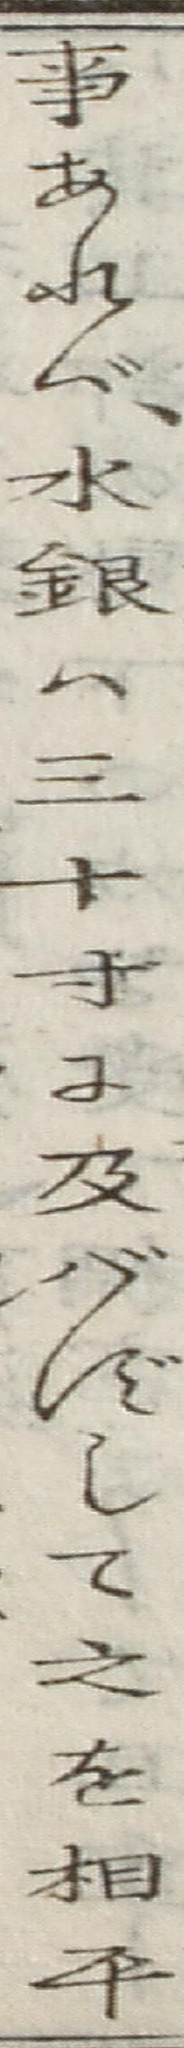事あれば、水銀は三十寸に及ばずして之を相平
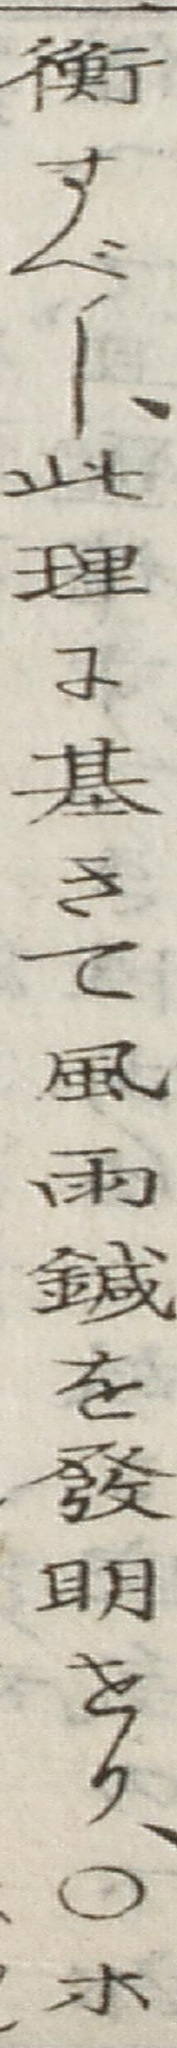衡すべし、此理に基きて風雨針を発明せり、○ホ
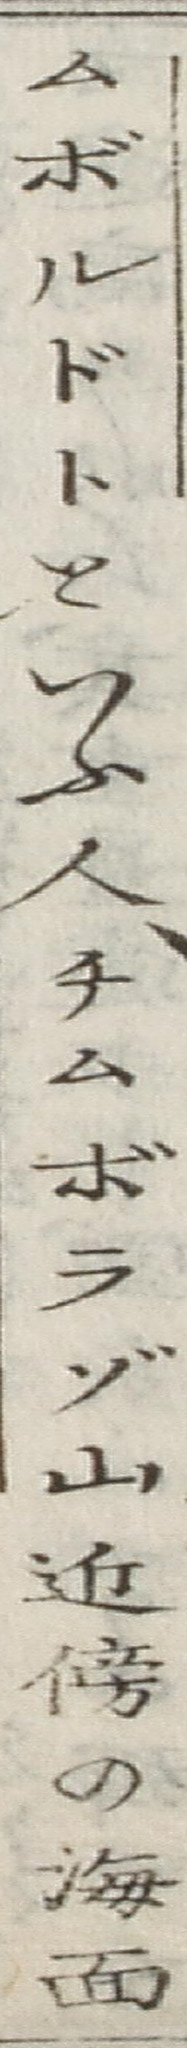ムボルドトといふ人、チムボラゾ山近傍の海面
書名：訓蒙　天然地理學　中
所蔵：東京大学地震研究所図書室 Earthquake Research Institute Library, The University of Tokyo, JAPAN
